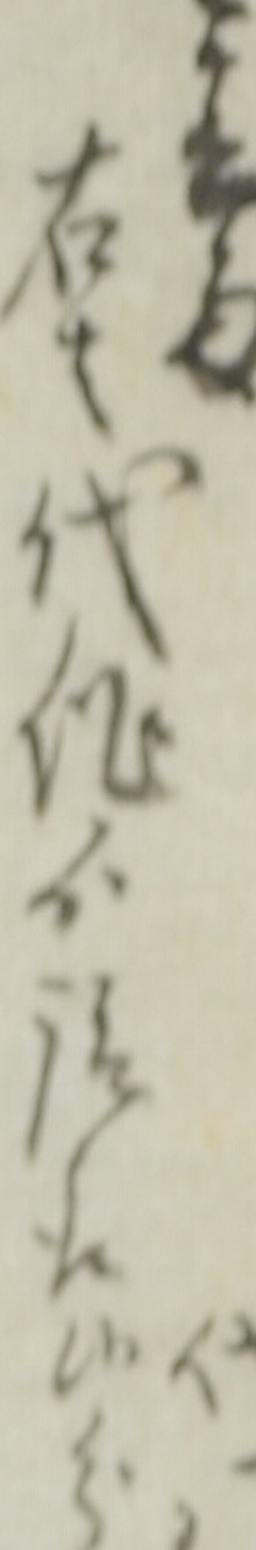右之代作ゟ請取候分
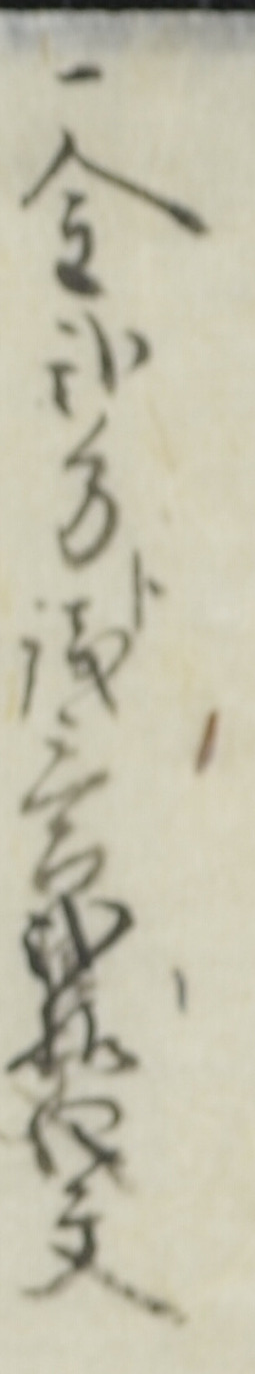一金弐分ト銭三百弐拾四文
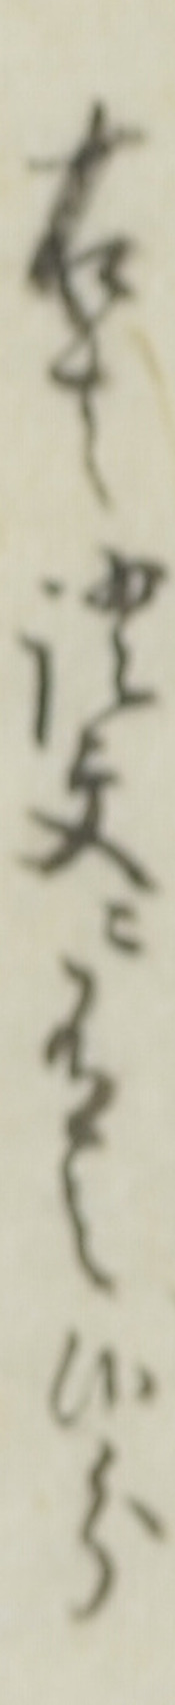右者証文二有之候分
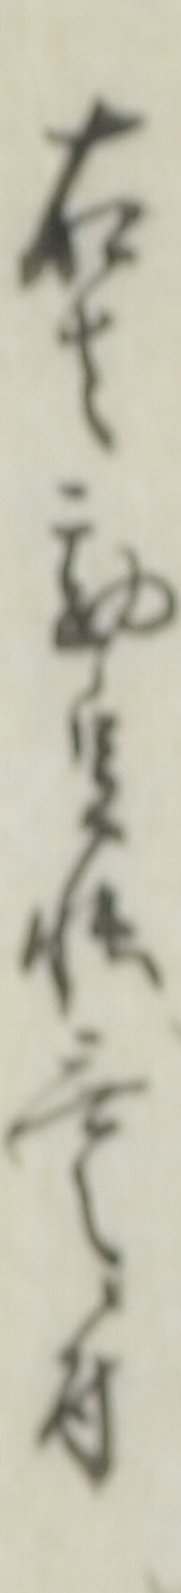右者勘定帳無之二付
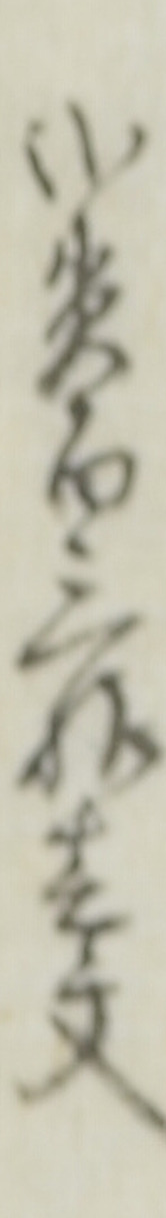弐貫百三拾壱文
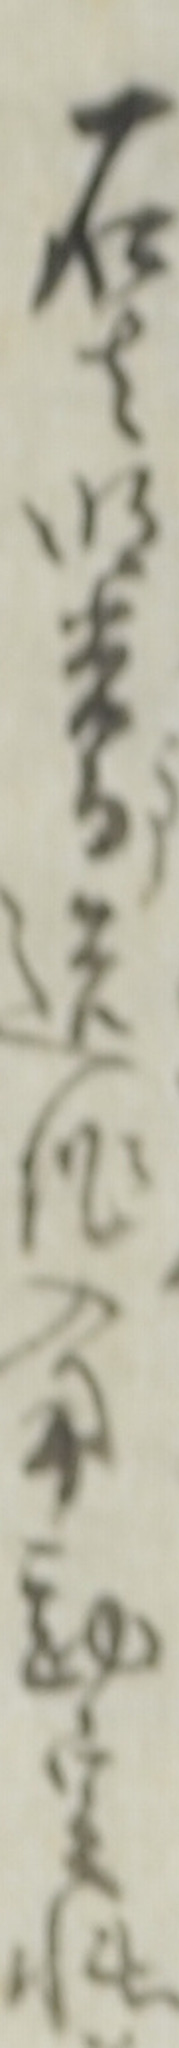右者明光寺造作入用勘定帳差引
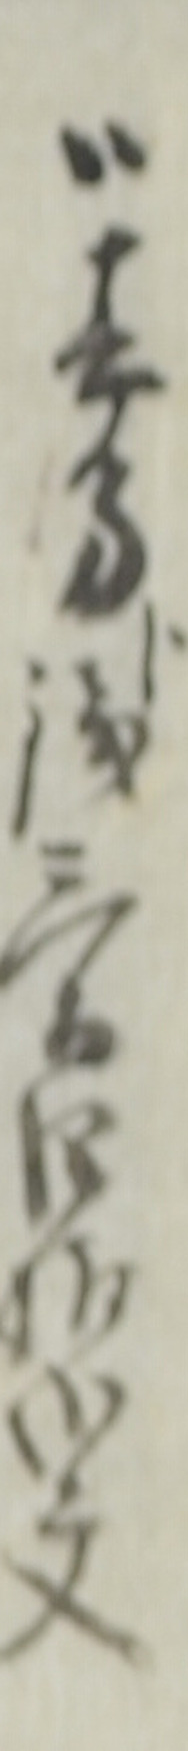〃壱分ト銭三百四拾弐文
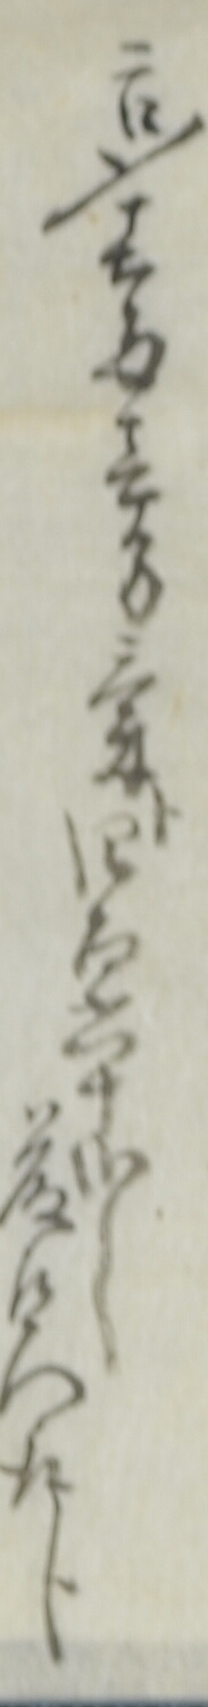二日〆壱両壱分三匁ト四百六十弐文
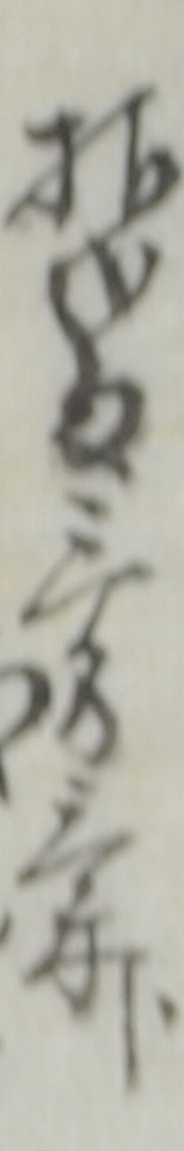拾弐両三分三朱

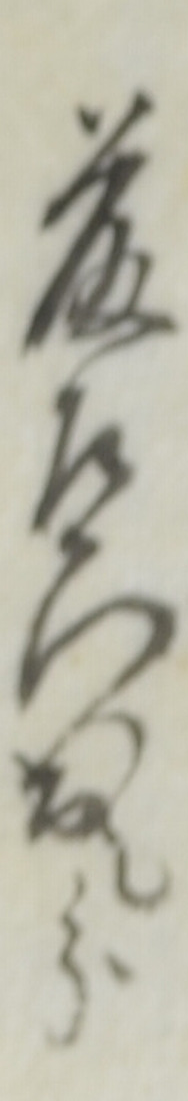藤左衛門出候分

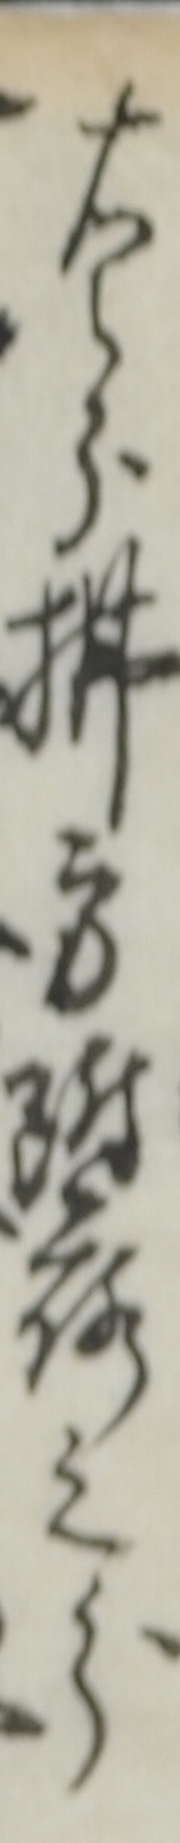右之分払方附荷之分
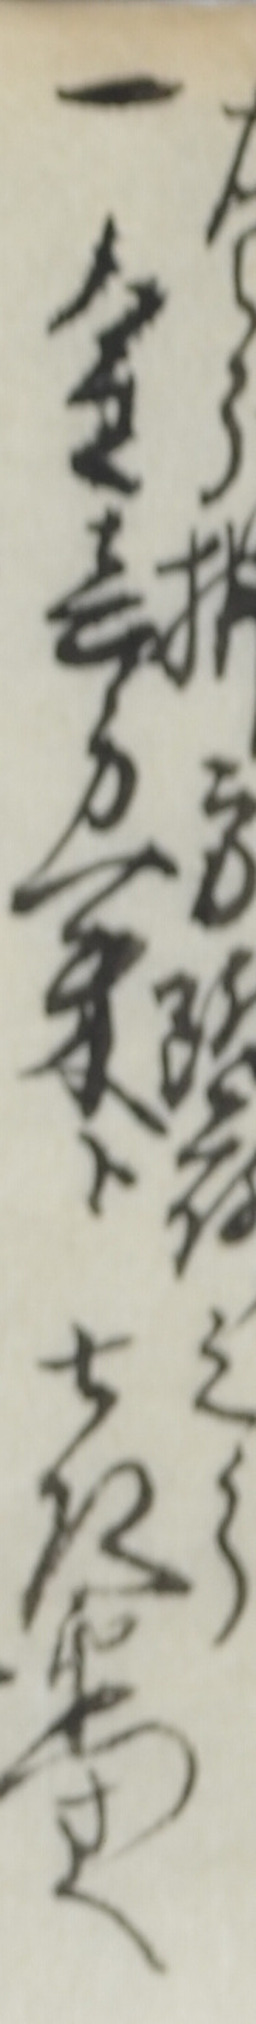一金壱分一朱ト七左衛門方へ
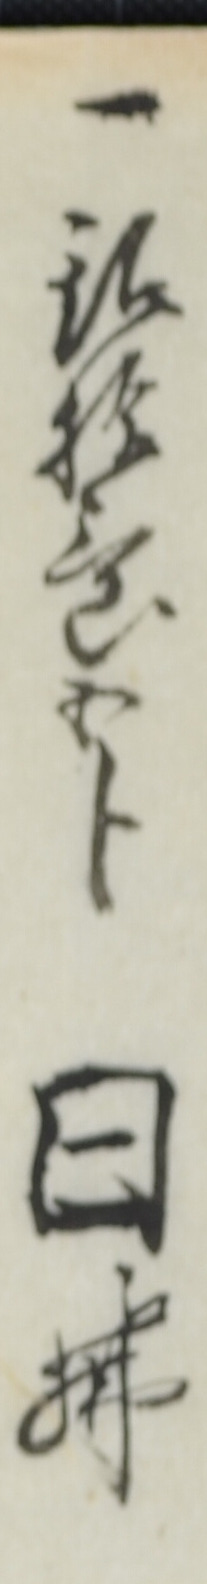一銀拾三匁五分日払
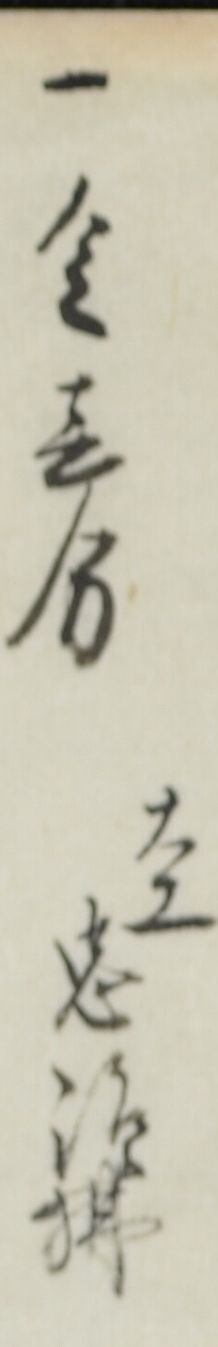一金壱分大工
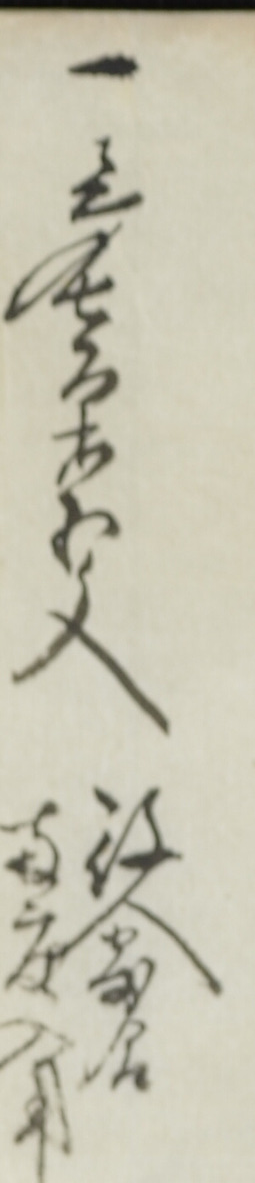一壱貫七百廿五文役人寄合
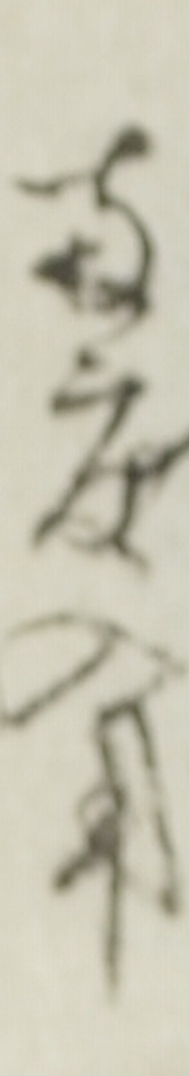両度入用
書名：（金銭勘定抜書）
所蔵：伊那市立高遠町図書館・合同会社AMANE
